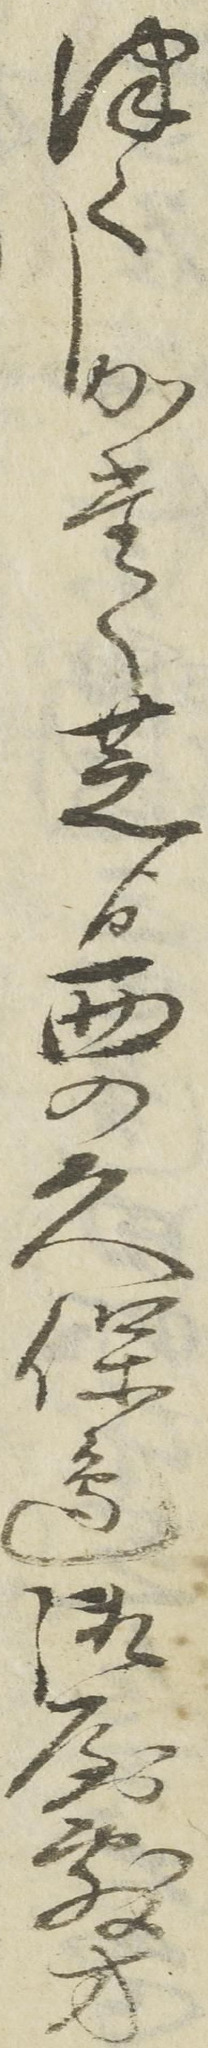つくしかたく芝ゟ西の久保辺御屋敷方
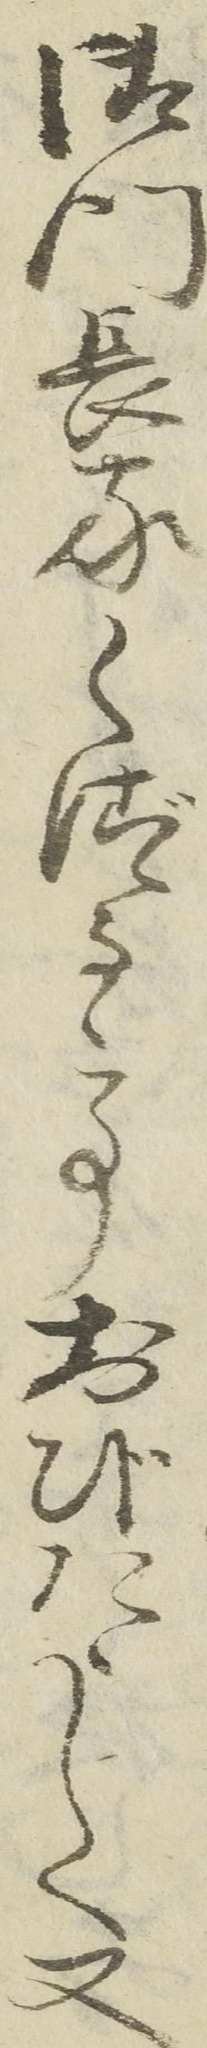御門長家くづるゝ事おびたゞしく又
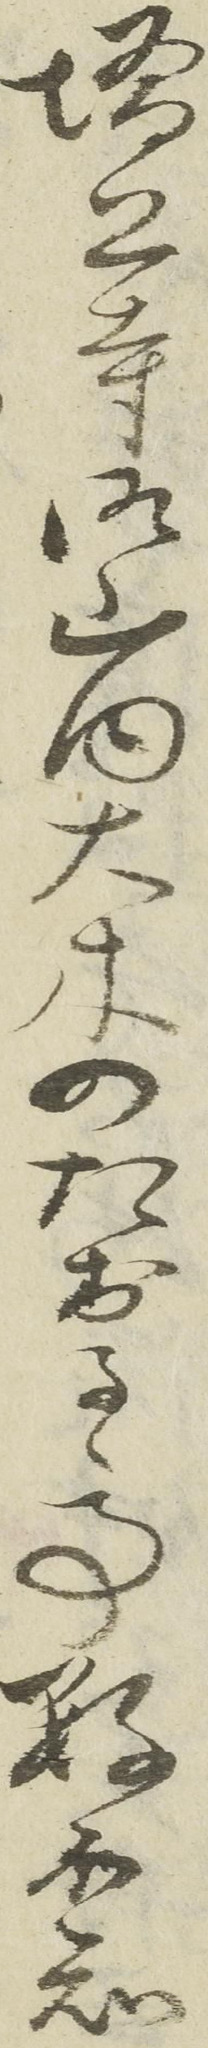増上寺御山内大木のたおるゝ事数不知
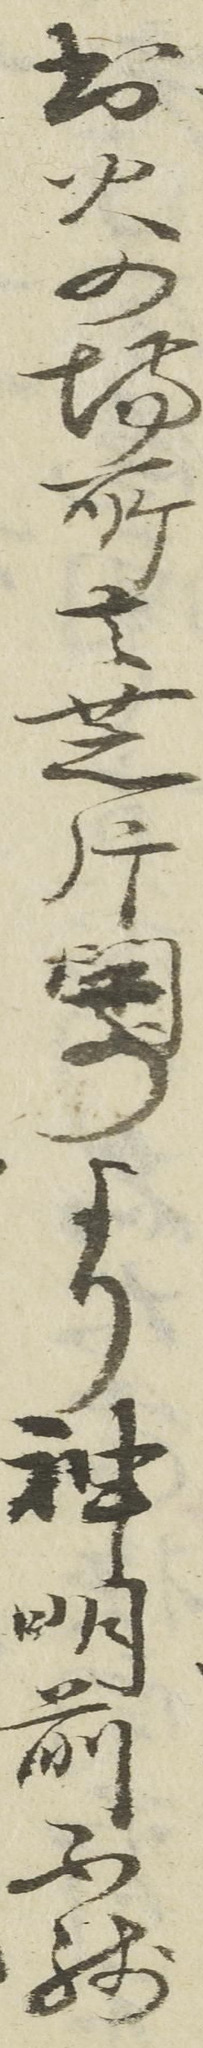出火の場所は芝片門前より神明前不残
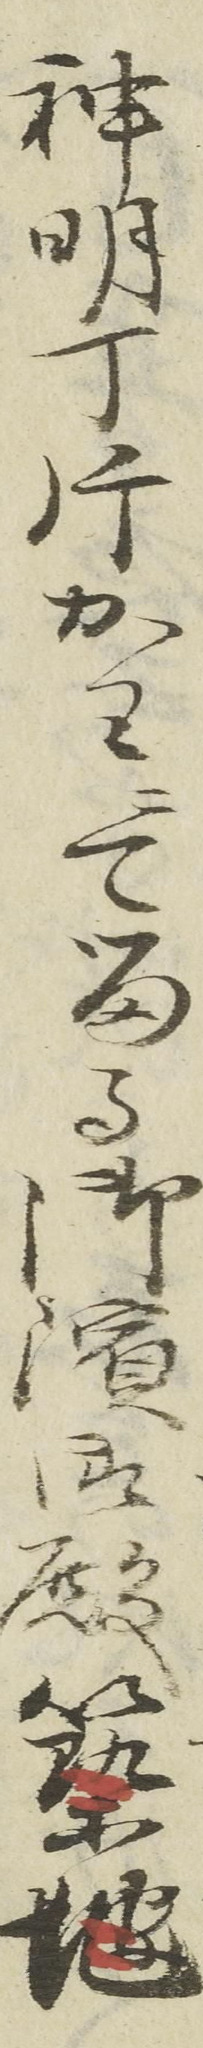神明丁片かわニて留る御濱御殿築地
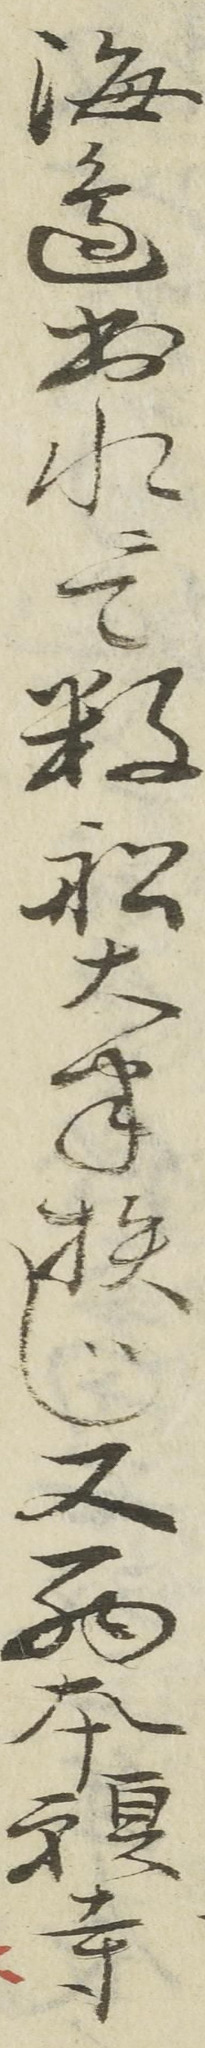海辺出水ニて数船大半損じ又西本願寺
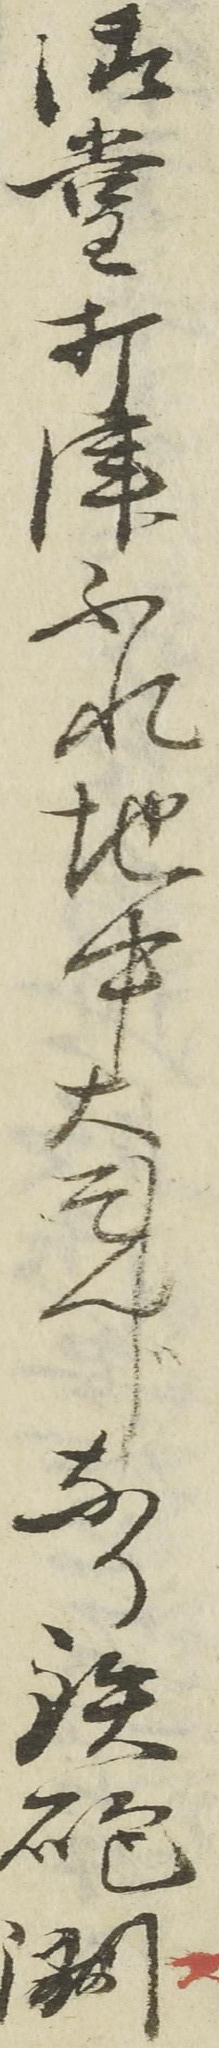御堂打つふれ地中大損じなり鉄砲洲ス
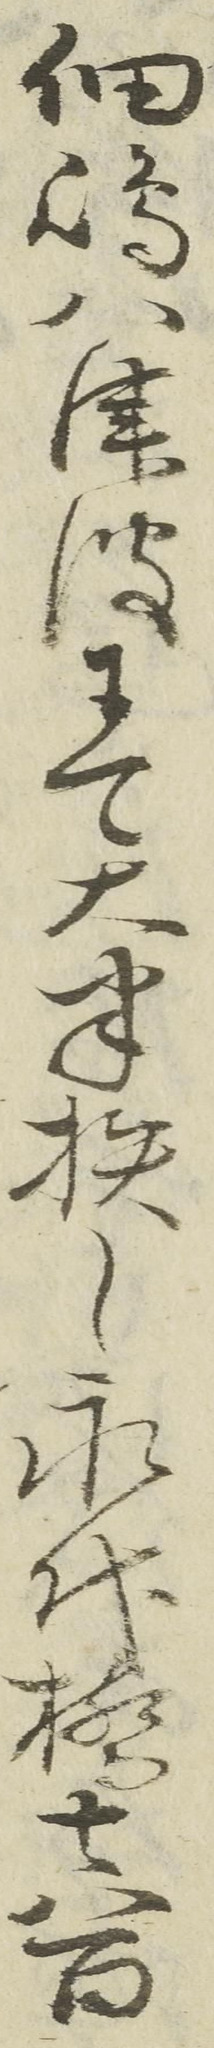佃嶋ハ津波にて大半損し永代橋は七八百
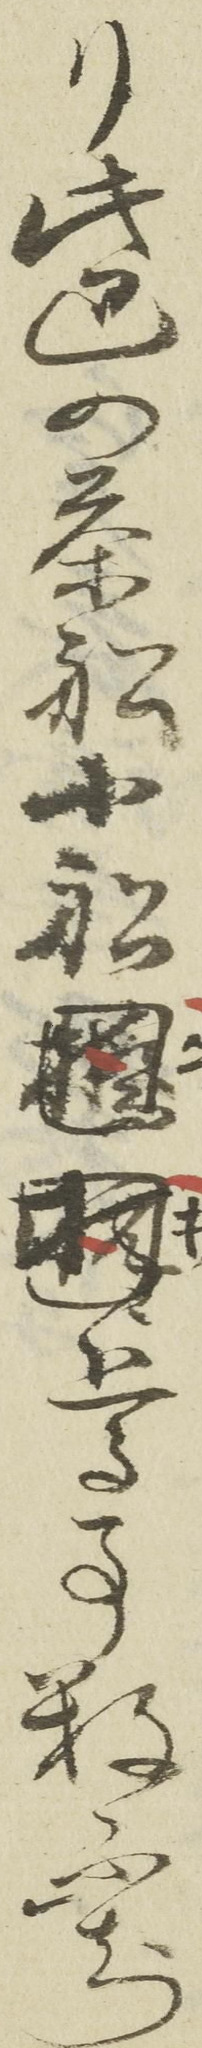り此辺の茶船小船橋杭上る事数不知
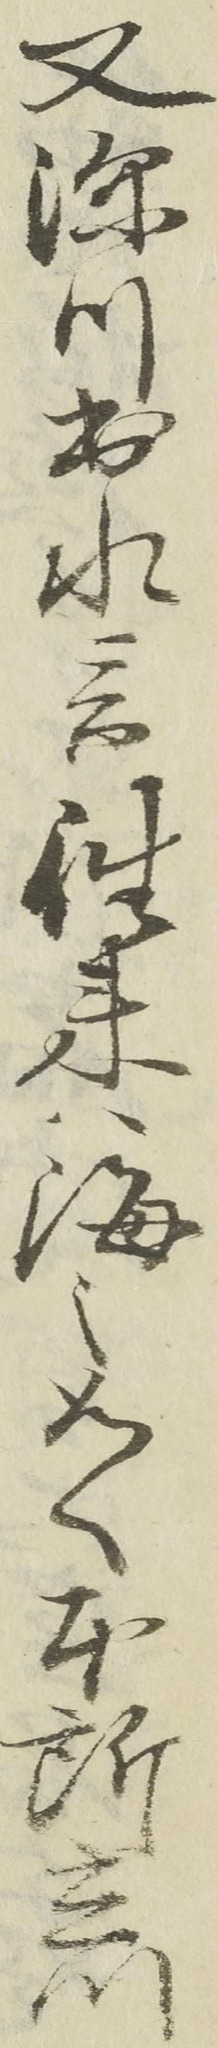又深川出水ニ而往来ハ海之如く本所立川
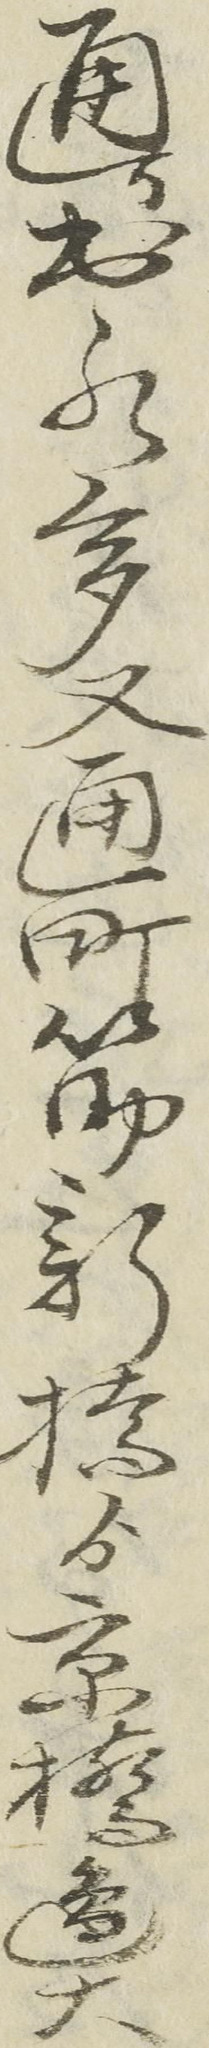通り出水多又通町筋新橋ゟ京橋辺大
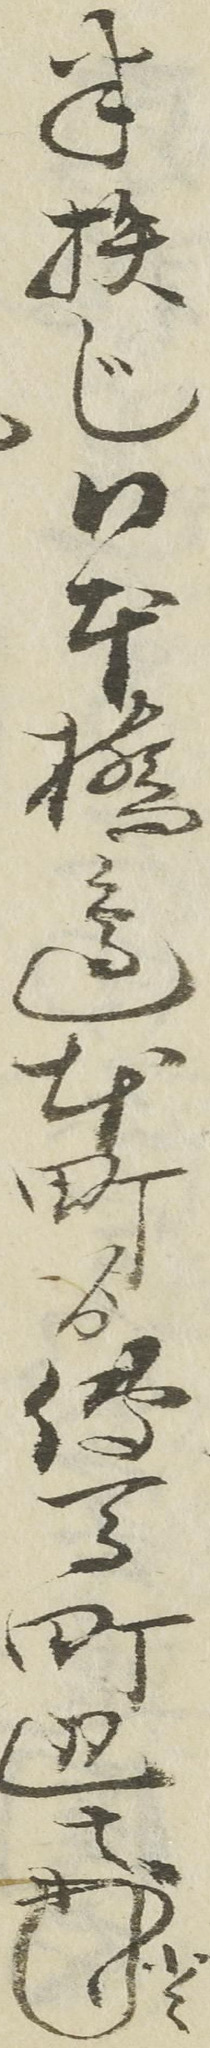半損じ日本橋辺本町ゟ傳馬町辺は少ゝ
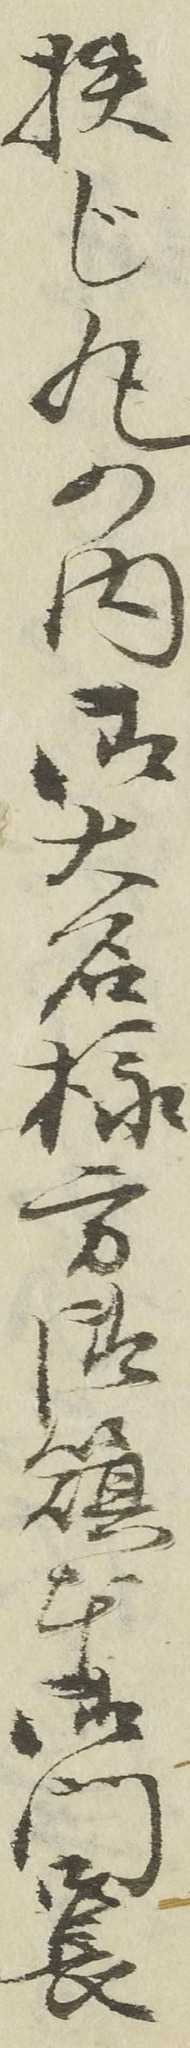損じ丸の内御大名様方御籏本御門御長
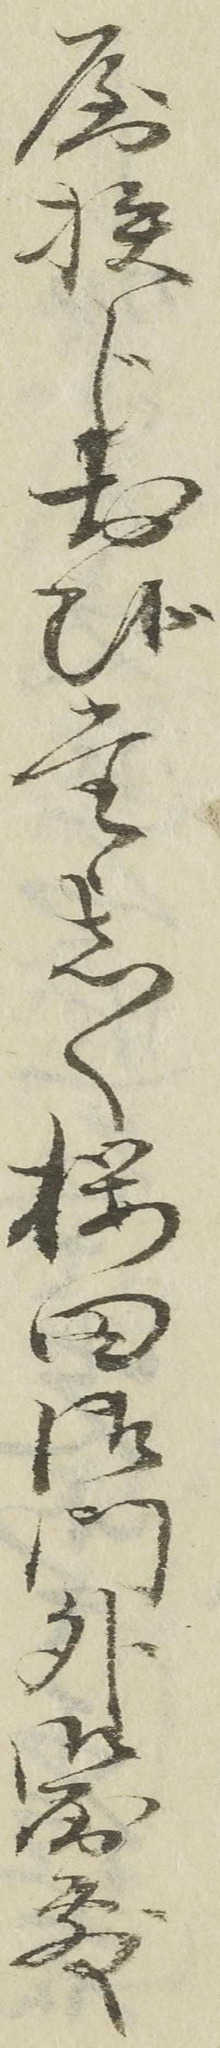屋損じおびたゝしく桜田御門外御屋敷
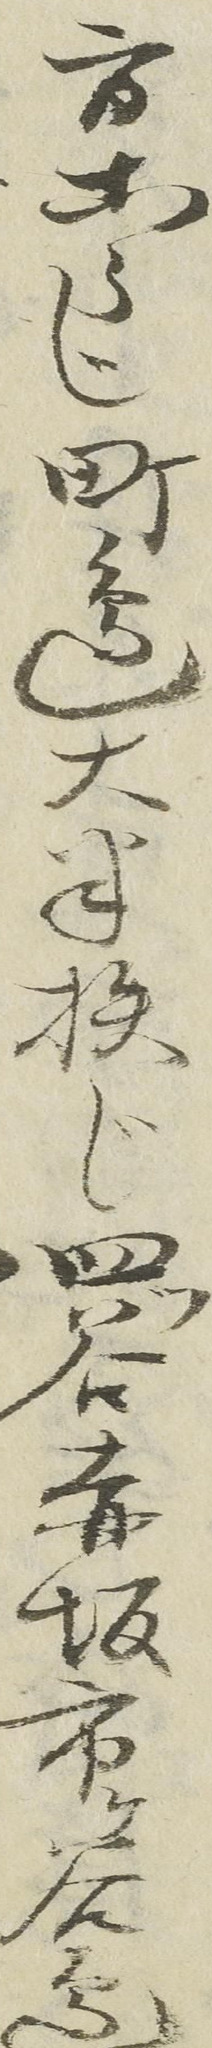方こうじ町辺大半損じ四ツ谷赤坂市ケ谷辺
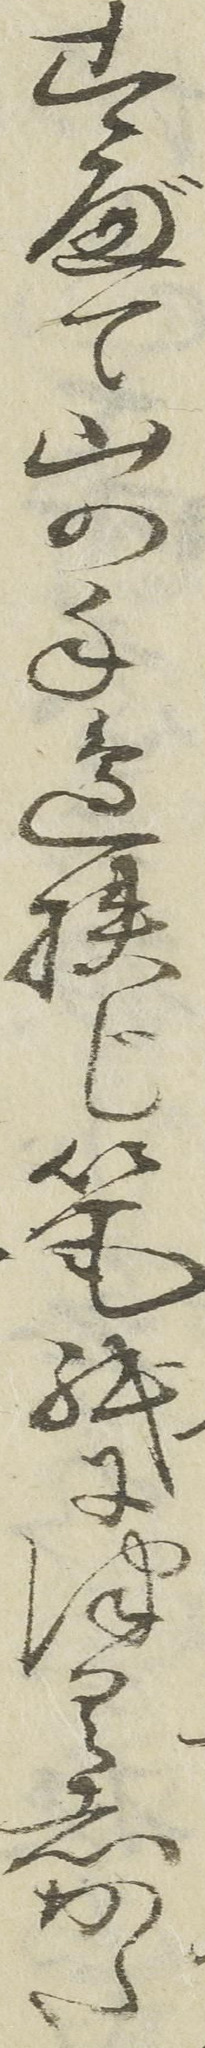すべて山の手辺損じ筆紙につくしかた
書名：安政乙卯江戸大地震筆記　安政丙辰八月大阪大雷雨之記追加　安政三辰年七月松前辺大地震并八月大風雨記録
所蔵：東京大学地震研究所図書室 Earthquake Research Institute Library, The University of Tokyo, JAPAN
